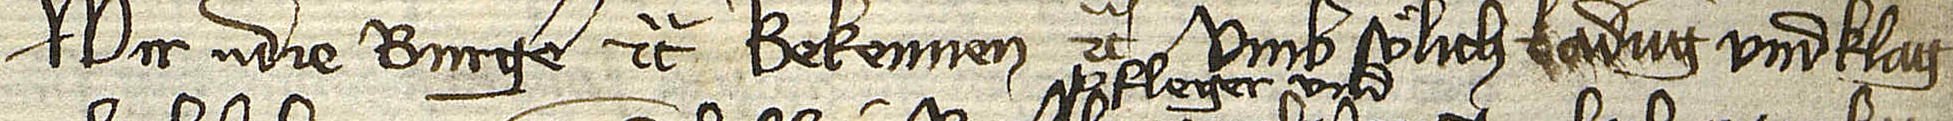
Wir ~ die Burge* ec* Bekennen ec* Vmb ſölich ladu*g vnd klag
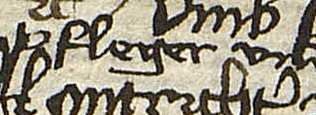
pfleger vnd
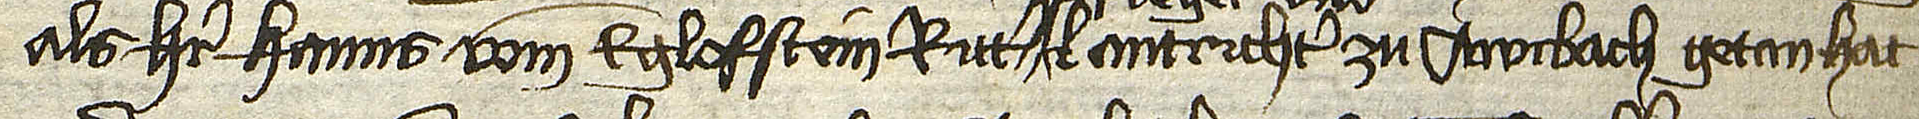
als h*r hanns vom* Eglofſtein Ritt* lantricht* ʒu Awrbach getan hat
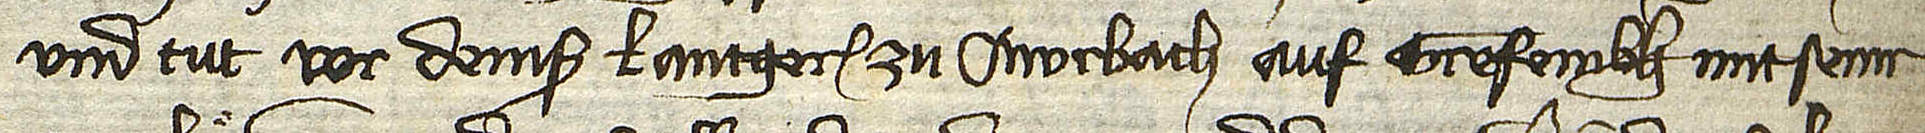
vnd tut vor demſ* lantger* ʒu Awrbach auf Grefemb*g mit ſeinr
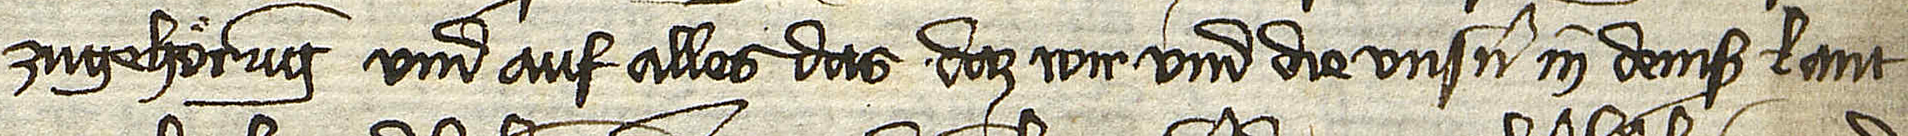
ʒugehöru*g vnd auf alles das . daʒ wir vnd die vnſ*n in demſ* lant
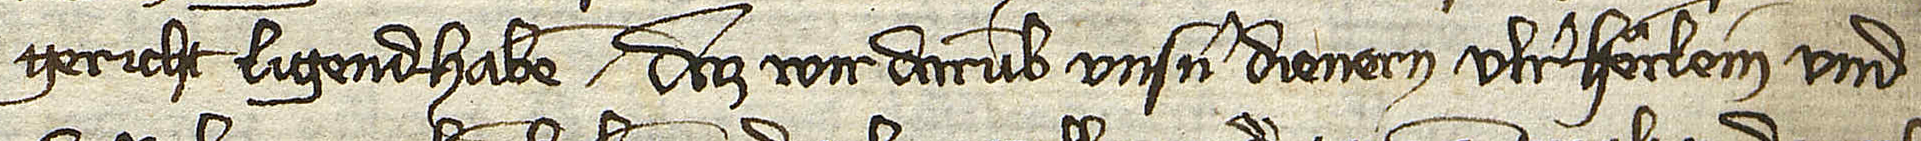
gericht ligend habe* / Daʒ wir daru*b vnſ*n dienern vlr* hërlein vnd
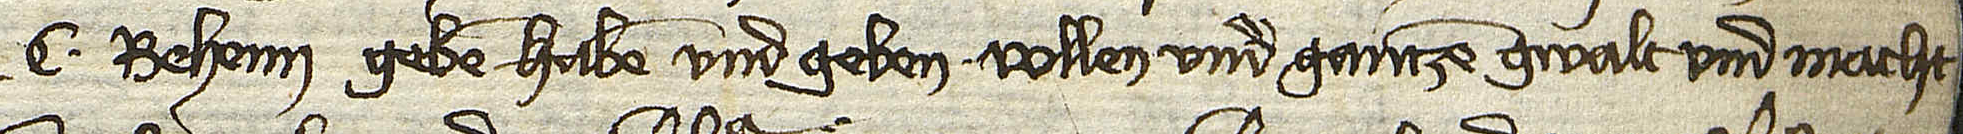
. C . Beheim gebe* habe* vnd geben . wollen vnd gancʒe* gwalt vnd macht
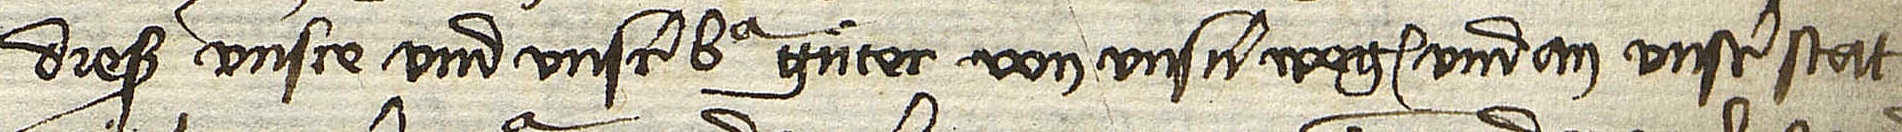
dieſ* vnſre vnd vnſ*r b* güter von vnſ*n weg* vnd an vnſr* ſtat
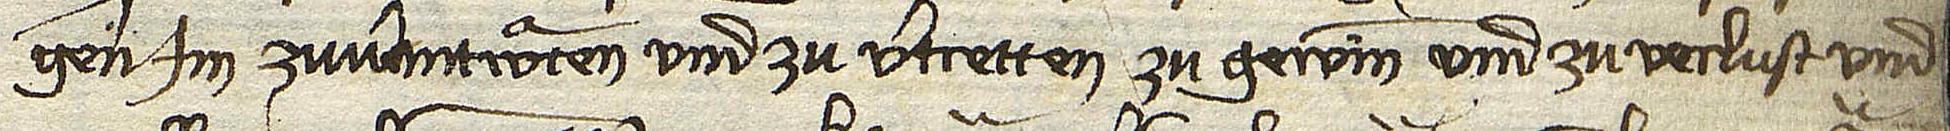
gen Im ʒuu*antw*ten vnd ʒu v*tretten ʒu gewin* vnd ʒu verluſt vnd
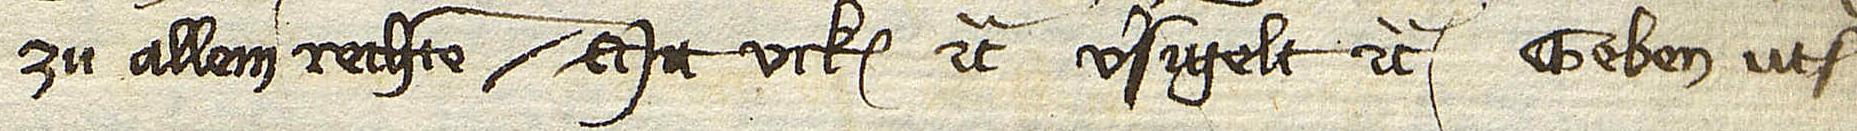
ʒu allem rechte* / Mit vrk* ec* v*ſigelt ec* Geben ut ſ*
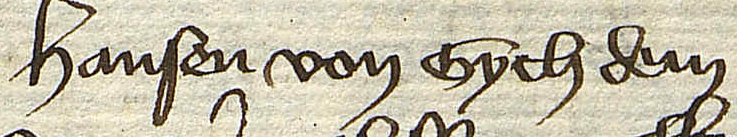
Hanſen von Gych dem
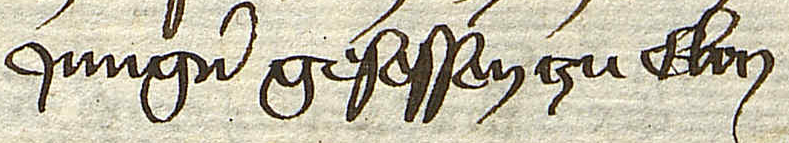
Iung*n geſeſſen cʒu Elrn
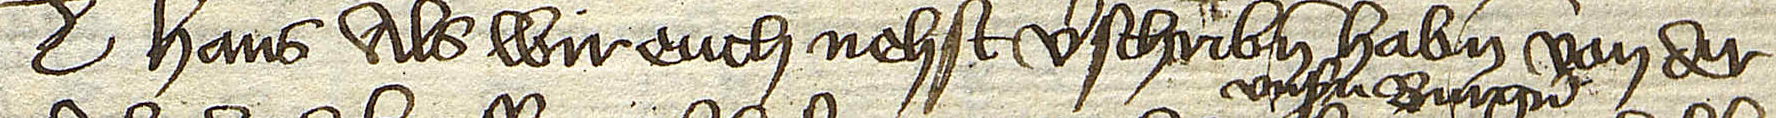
L* hans Als wir euch nehſt v*ſchrib*n hab*n von der
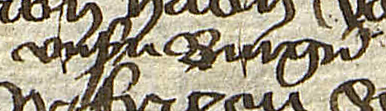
vnſ*n Burg*n
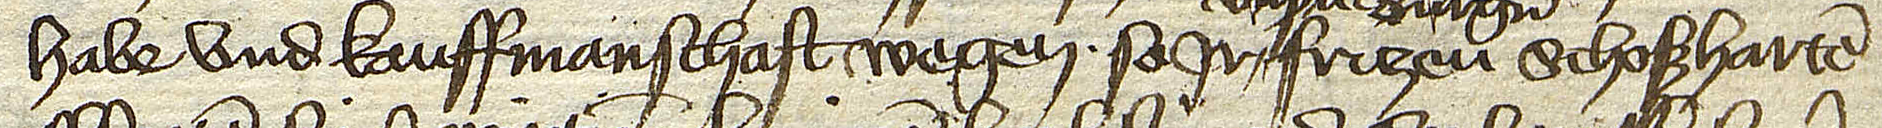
habe vnd kauffmanſchaft wegen . ſo Ir fricʒen Schoſʒharte*
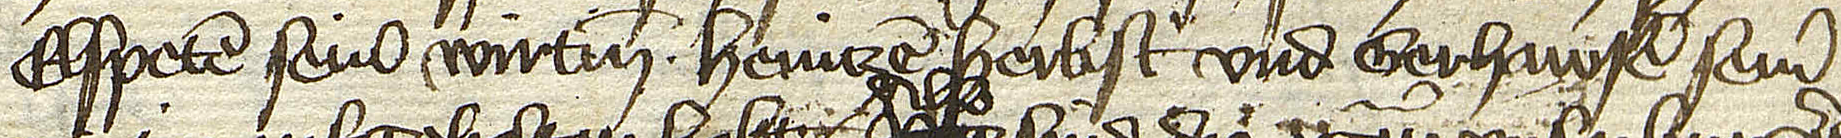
Elſpete* ſein* wirtin* . heincʒe* herbſt vnd Gerhawſe* ſein*
